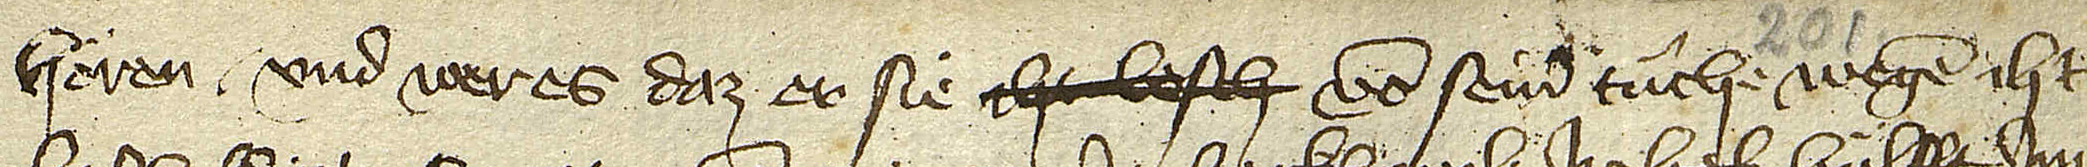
hören / vnd wer es daʒ er ſie iht beſch vo* ſein* tüche wege* iht
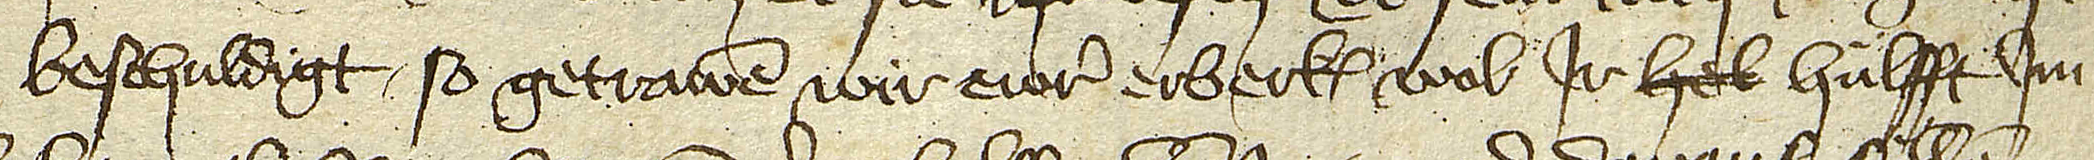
beſchuldigt / ſo getrawe* wir ewr* erberk* wol Ir hel hülfft Im
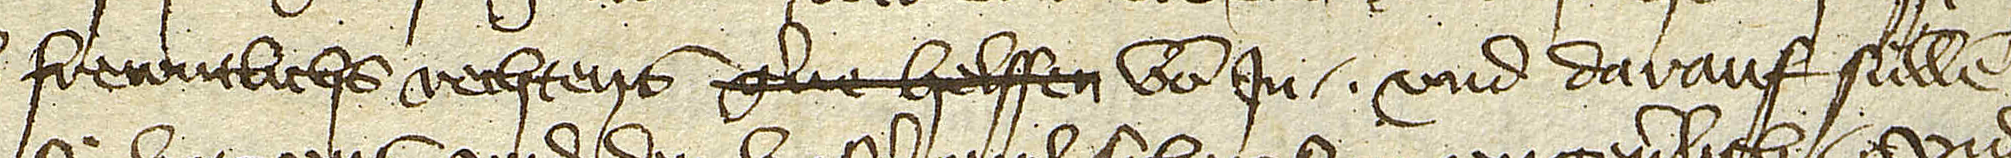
frewntlichs rechtens g*ne helffen vo* In / . vnd darauf ſülle*
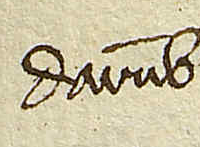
darub*
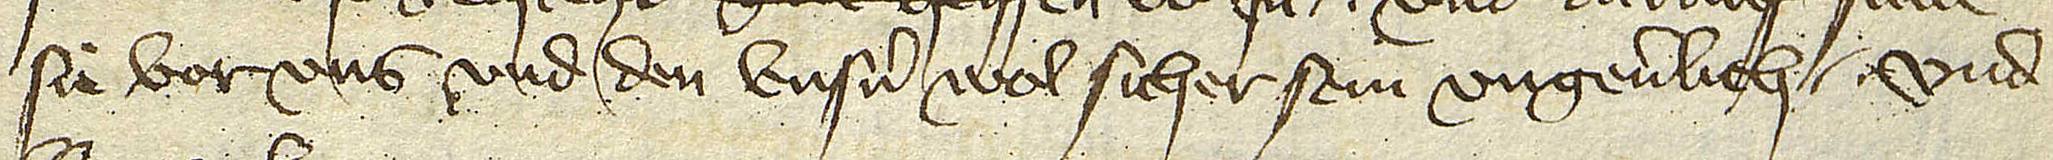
ſie vor vns vnd den vnſn* wol ſicher ſein vngeu*lich / . vnd
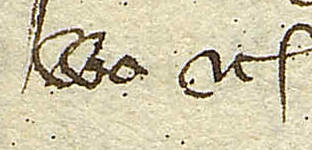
wo ec*
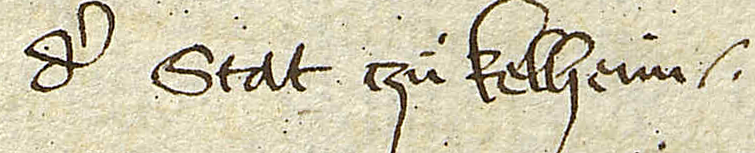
d* Stat cʒü Kelheim / .
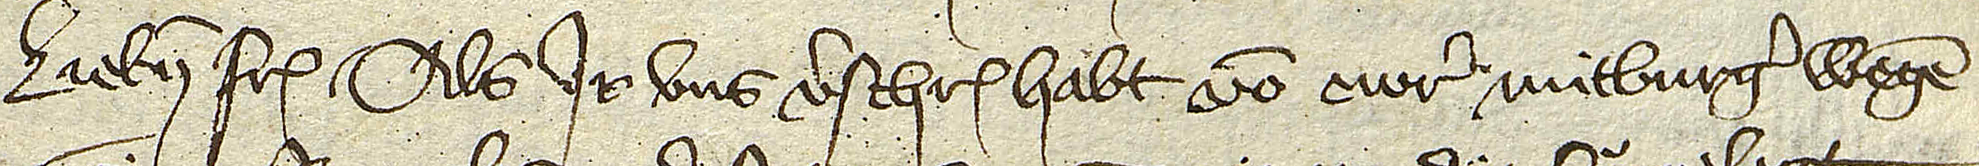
Liebn* fr* / Als Ir vns v*ſchr* habt vo* ewr* mitburg* wege*
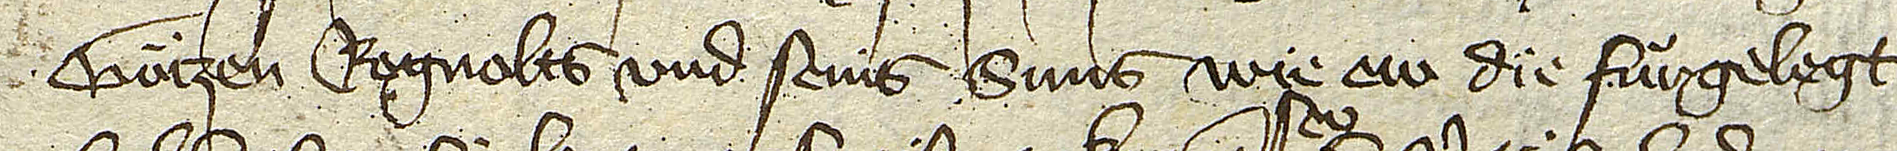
Göcʒen Regnolts vnd ſeins Suns wie ew die fürgelegt
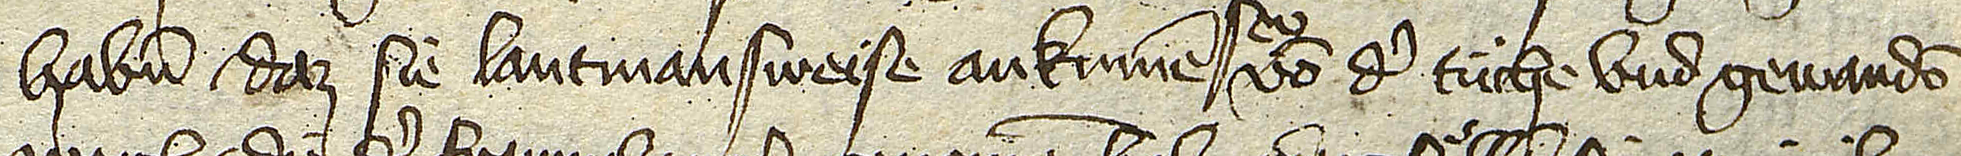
habn* / daʒ ſie lantmanſweiſe ankume* vo* d* tüche vnd gewands
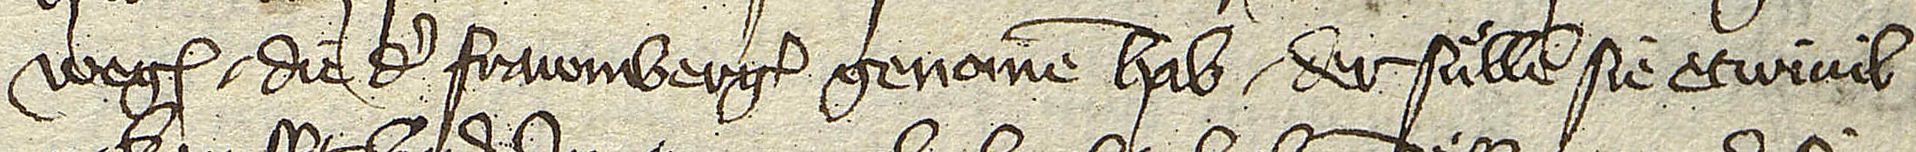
weg* / die d* frawmberg* genome* hab / der ſülle* ſie etwieuil
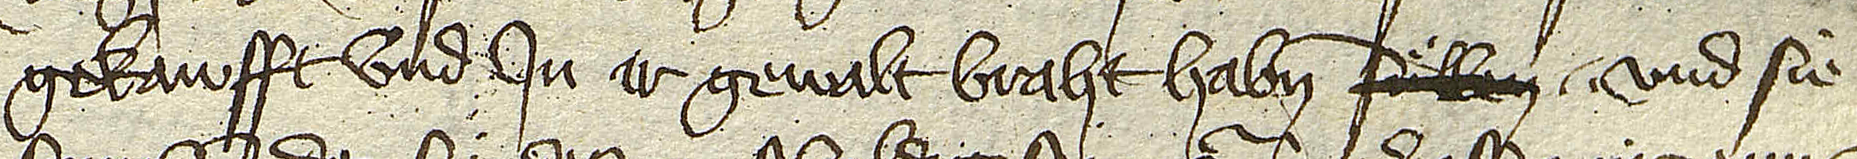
gekawfft vnd In ir gewalt braht habn* ſüllen / vnd ſie
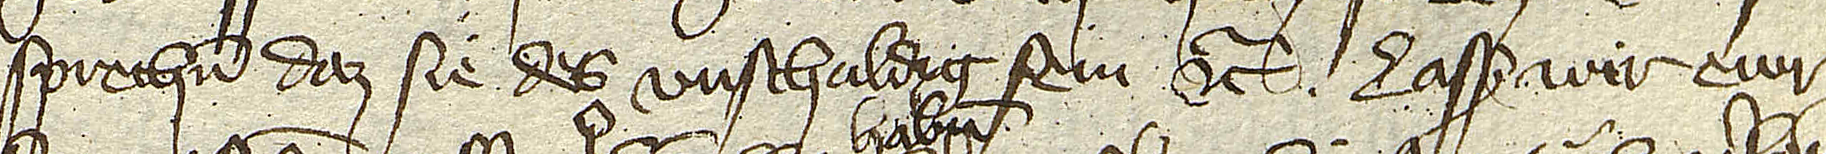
ſprechn* daʒ ſie des vnſchuldig ſein ec* . Laſſ* wir ewr
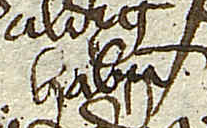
habn*
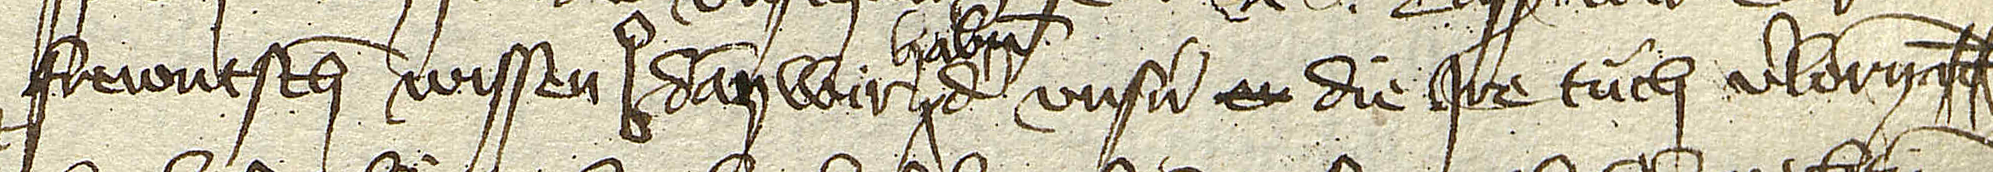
frewntſch* wiſſen / dan* wir d* vnſn* e die Ire tüch v*lorn* ec*
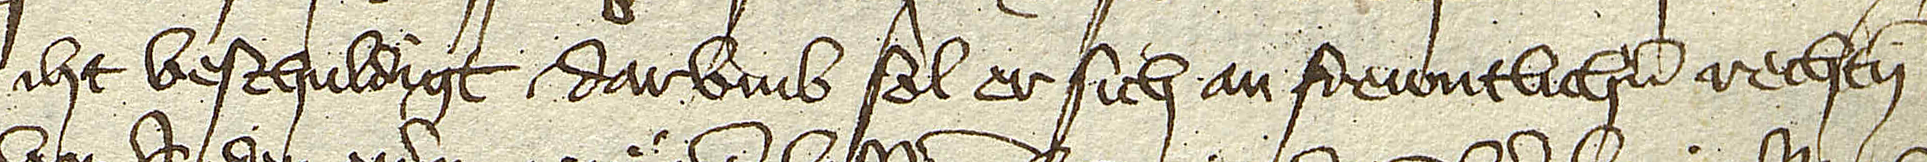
iht beſchuldigt / darvmb ſol er ſich an frewntlichn* rechtn*
